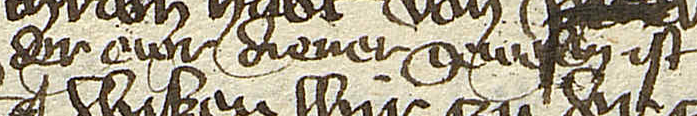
der ewr diener geweſen iſt
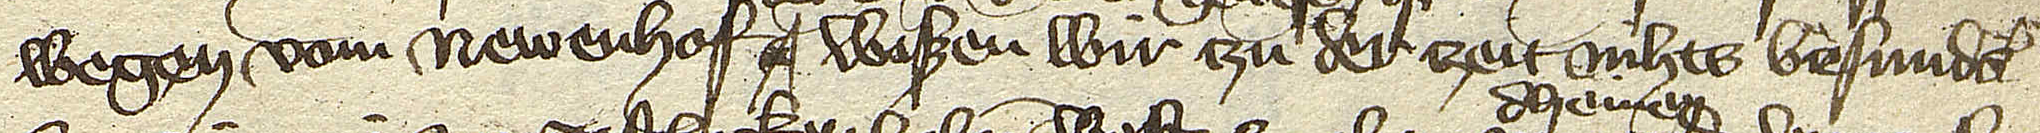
wegen vom Newenhof wiſʒen wir cʒu der cʒeit nihts beſunds*
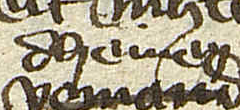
dheinen
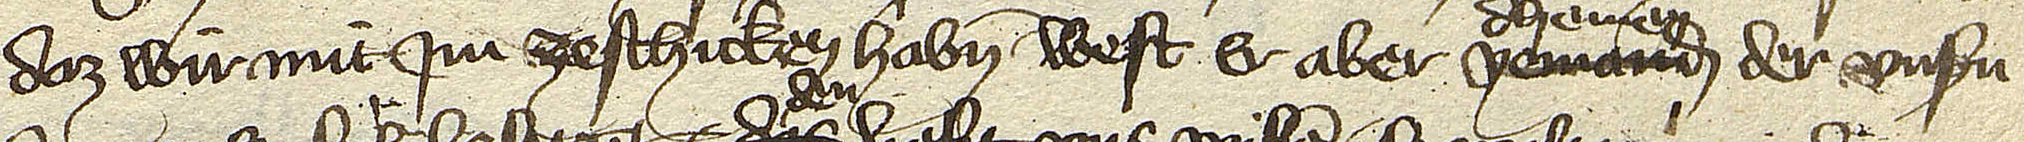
daʒ wir mit Im cʒeſchicken / weſt Er aber yemand* der vnſ*n
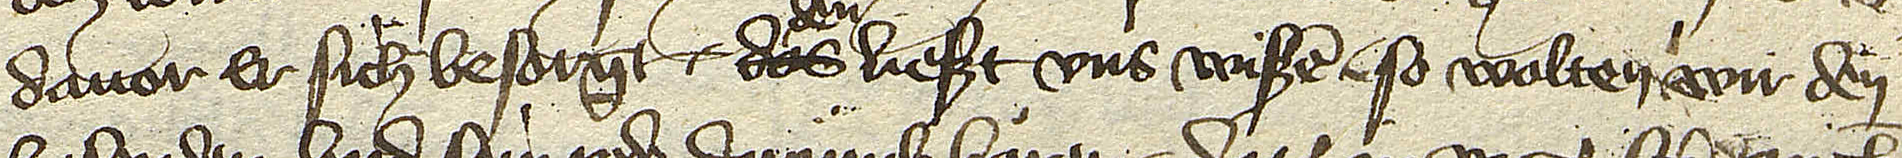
dauor Er ſich beſorgt / das lieſʒt vns wiſʒe* / ſo wolten wir den
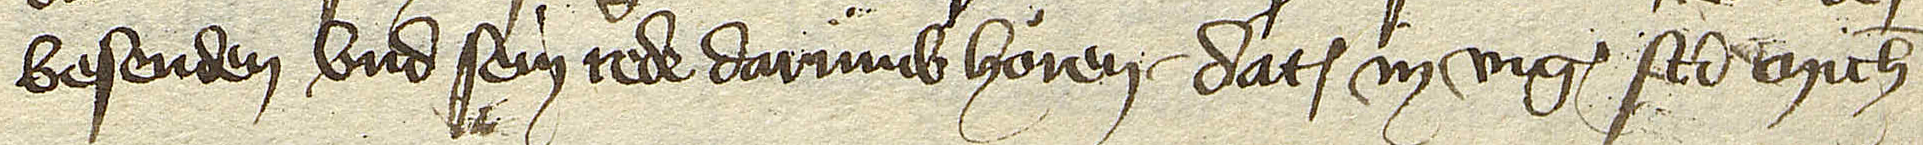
beſenden vnd ſein rede darümb hören / dat* in vig* ſci* Mich*
